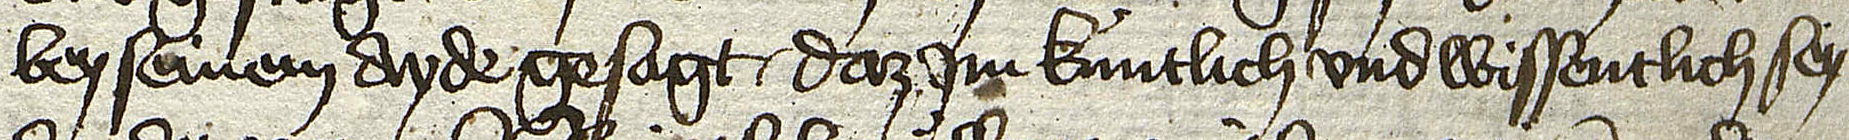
bey ſeinem Ayde geſagt / daʒ Im küntlich vnd wiſſentlich ſey
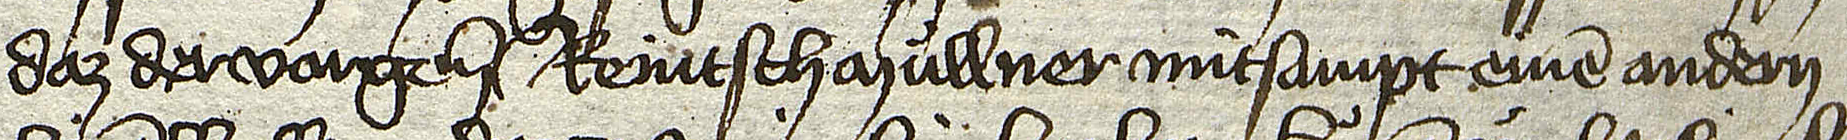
daʒ der vorgen* ReintſchMüllner mitſampt eine* andern
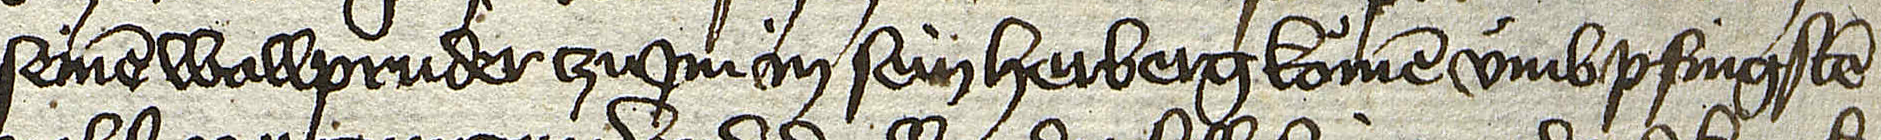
ſeine* wallpruder ʒu Im in ſein herberg köme* v̈mb pfingſte*
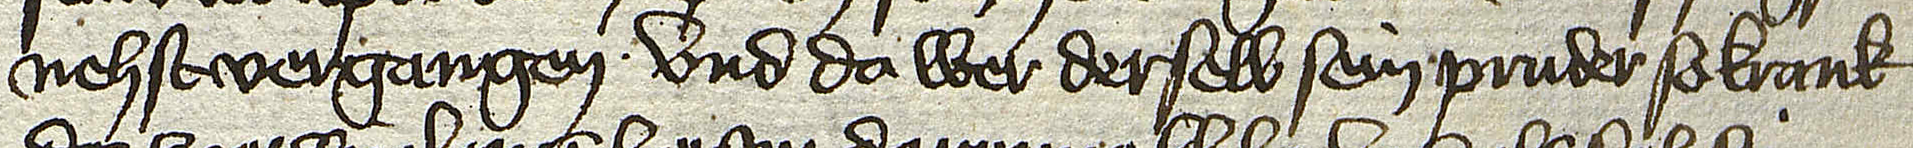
nehſt vergangen . Vnd da wer derſelb ſein pruder ſo krank
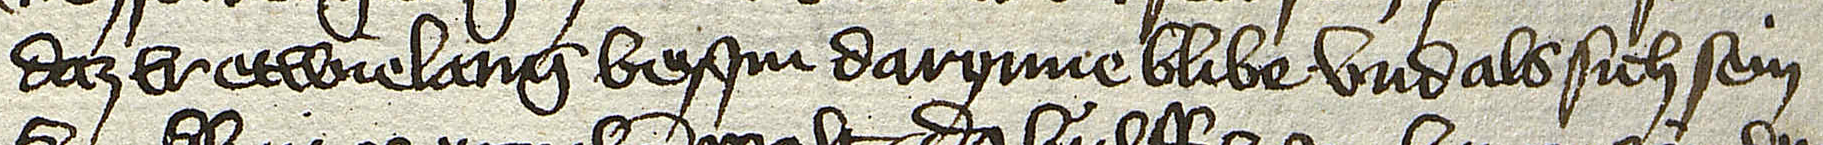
daʒ er etwielang bey Im darynne blibe . Vnd als ſich ſein
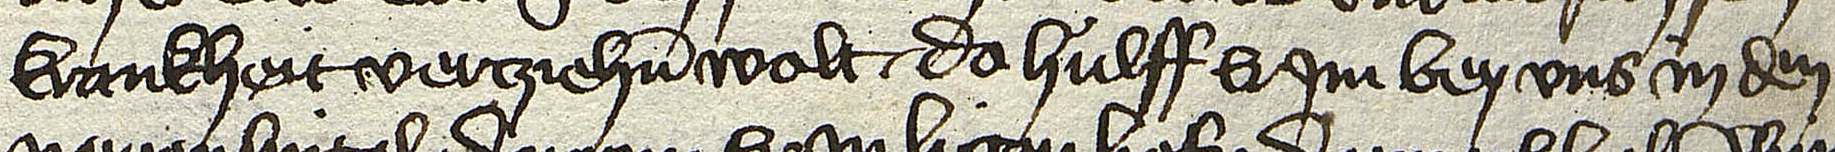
krankheit vercʒieh*n wolt / do hülff er Im bey vns in dem
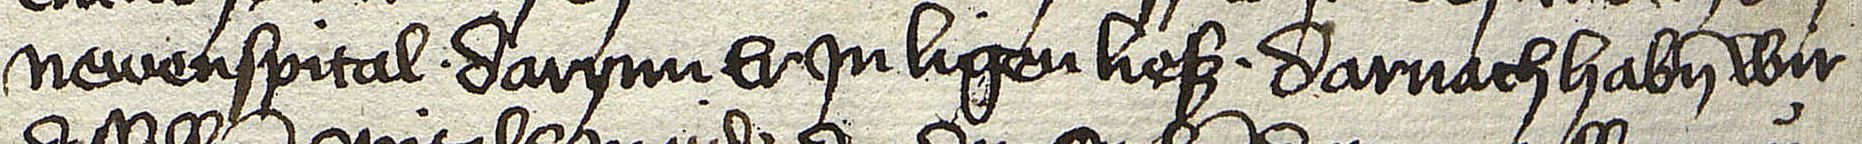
newenſpital . darynn Er In ligen lieſʒ . Darnach hab*n wir
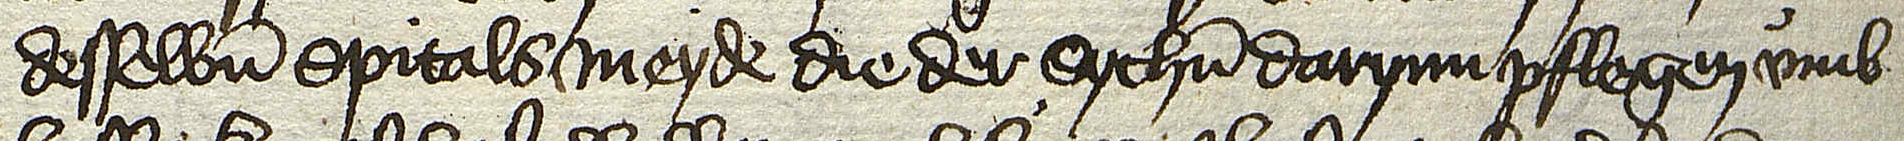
deſſelb*n Spitals meyde die der Sych*n darynn pflegen v̈mb
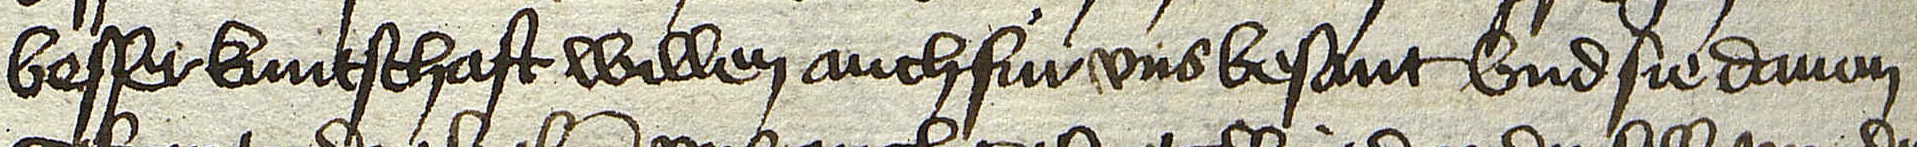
beſſer kuntſchaft willen auch für vns beſant vnd ſie dauon
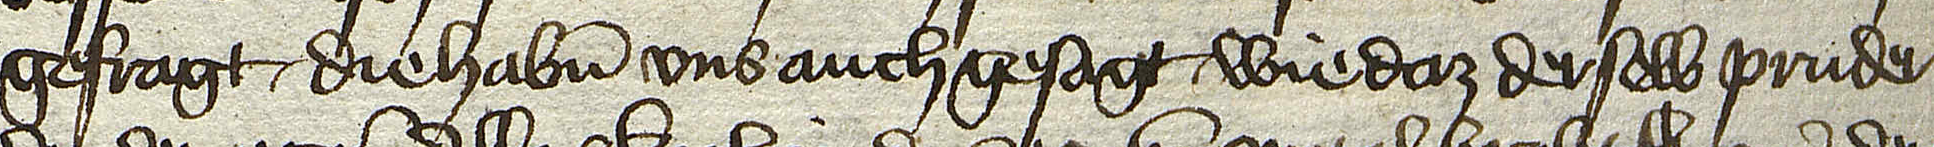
gefragt / die hab*n vns auch geſagt / wie daʒ derſelb pruder
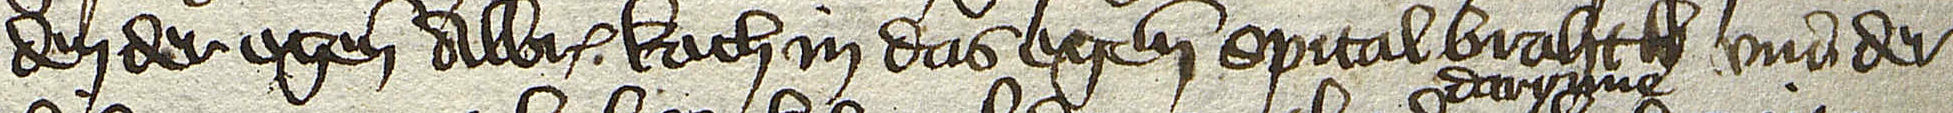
den der egen* Albr* Koch in das egen* Spital braht h vnd der
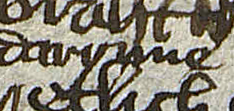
darynne
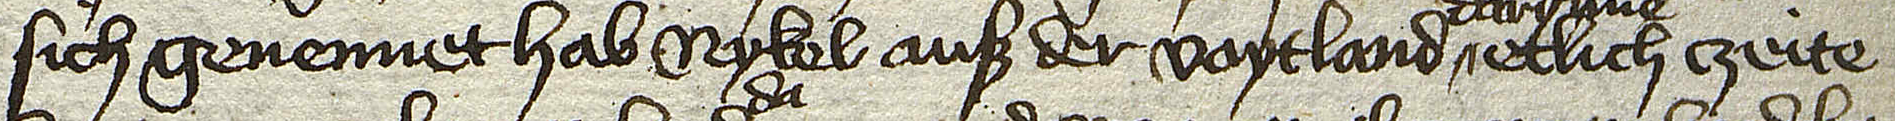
ſich genennet habt Nykel auſʒ der voytland etlich cʒeite
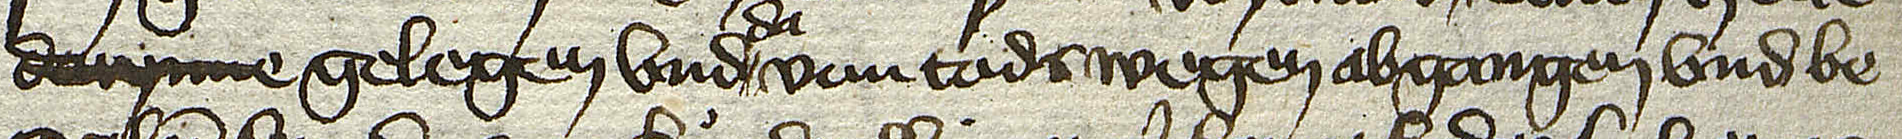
darynne gelegen vnd von tods wegen abgangen vnd be
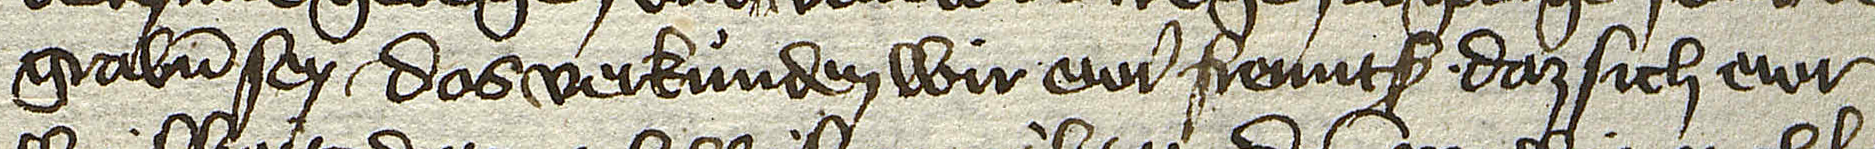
grab*n ſey / das verkünden wir ew*r frewntſ* . daʒ ſich ewr
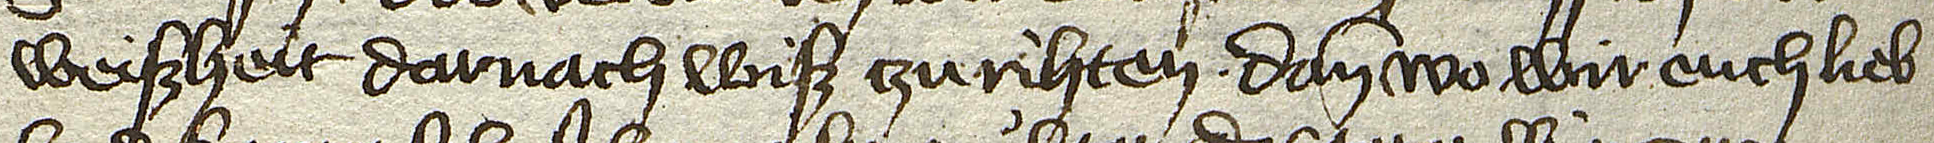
weiſ*heit darnach wiſʒ cʒu rihten . dan* wo wir euch lieb
